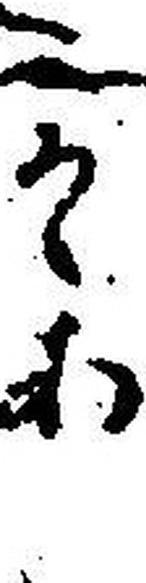かゝあ
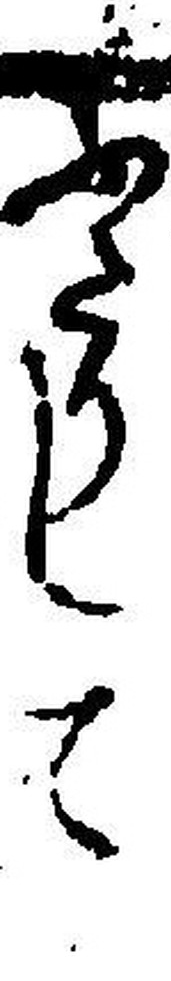ふたりして
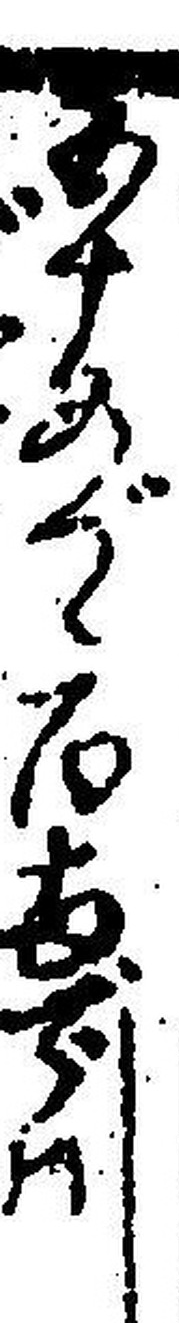五十めづゝ百両では
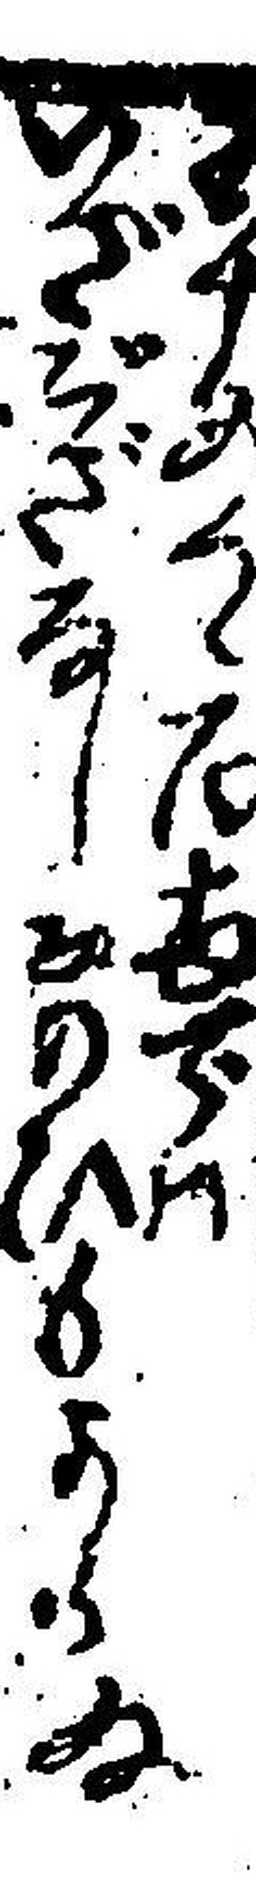いざござなしおもひもよらぬ
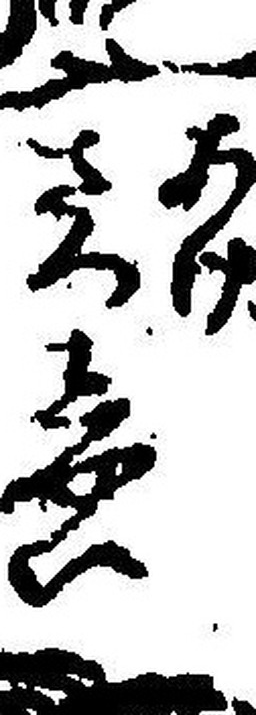さつしやい
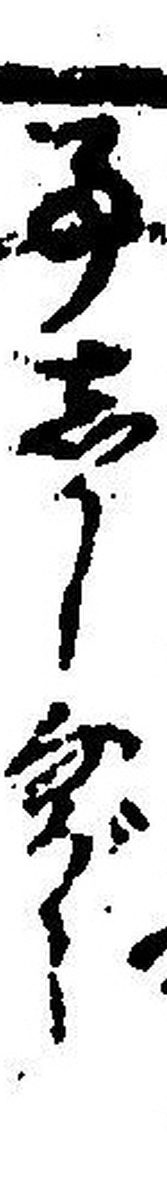事しかしながら
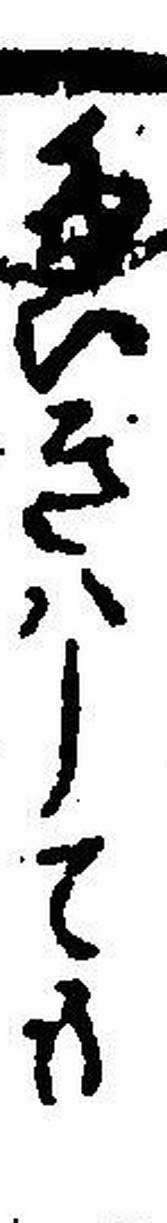たいきはしても
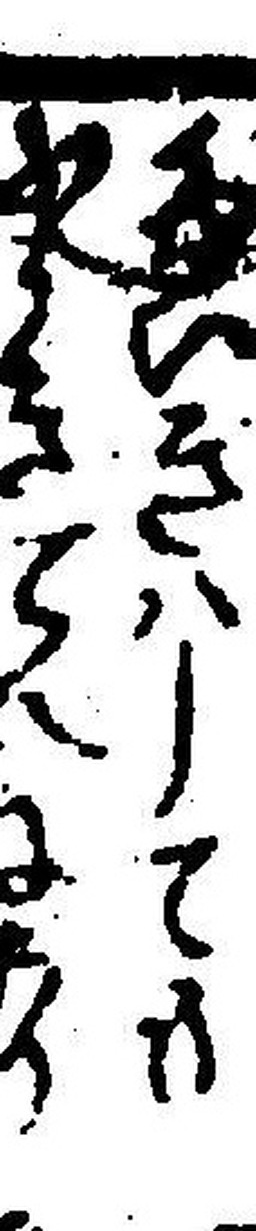ふうきてんにあり
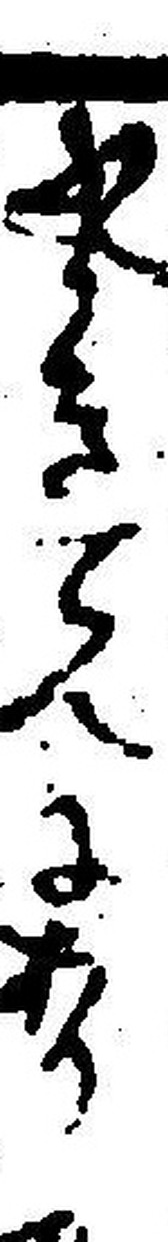ふうきてんにあり
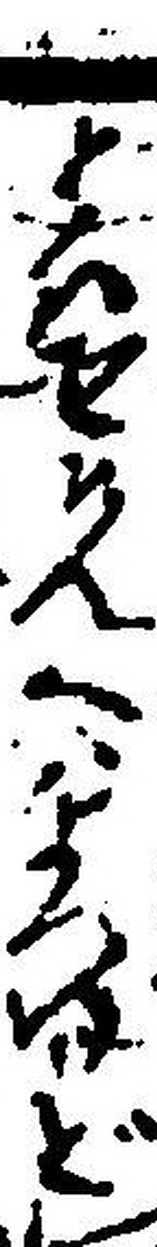とはせけんへはよつほど
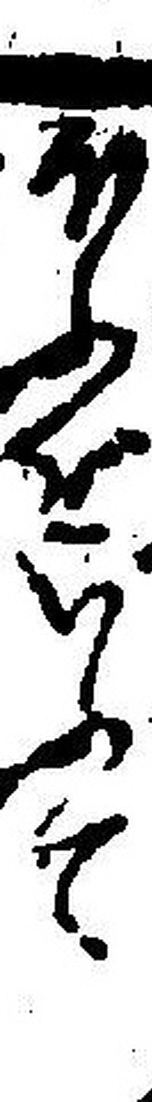ほふをいふて
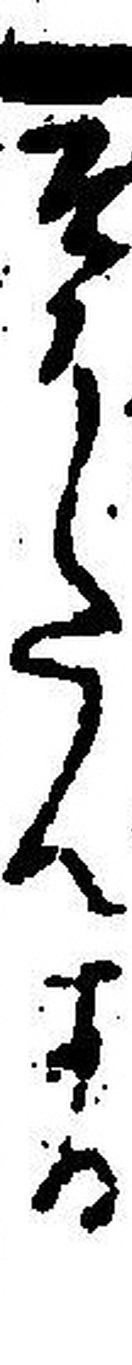そうたんする

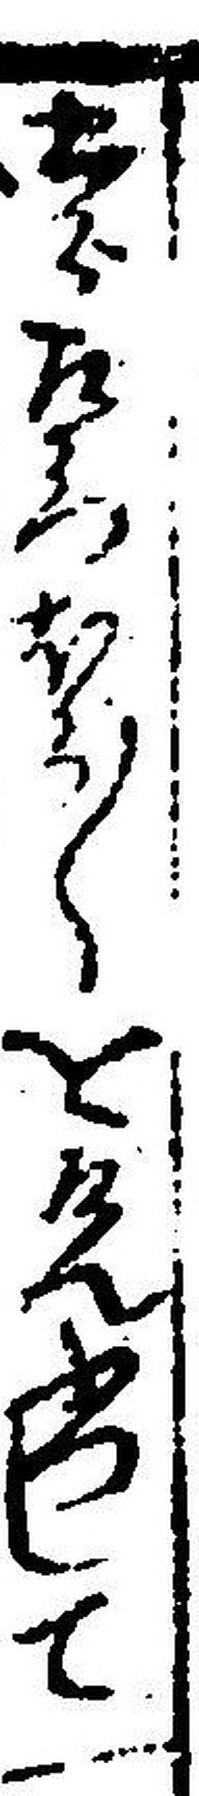太郎左衛門ほう〳〵をけんふつして
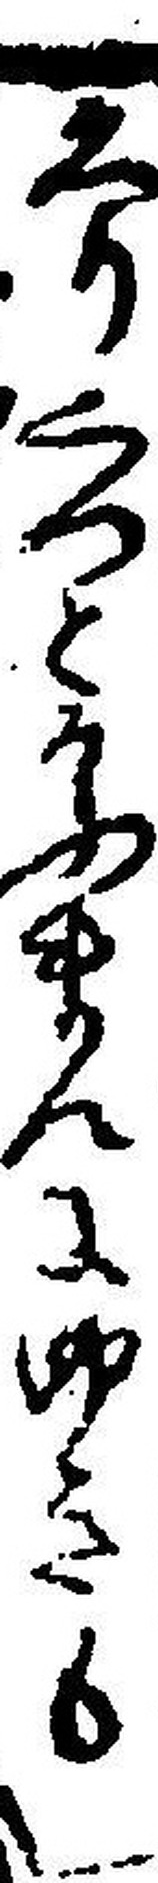かへりくつとかふまんにゆきも
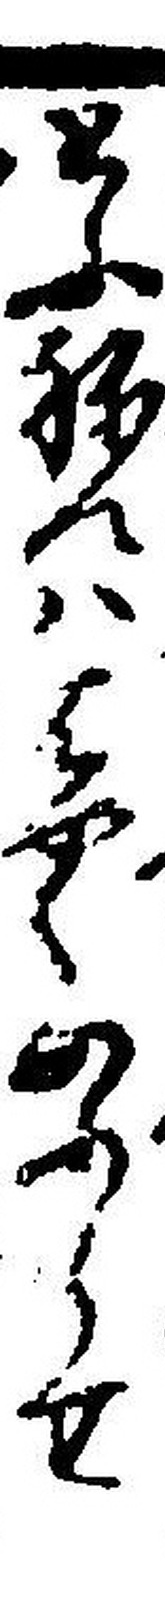とふねんははやくい？ふらせ
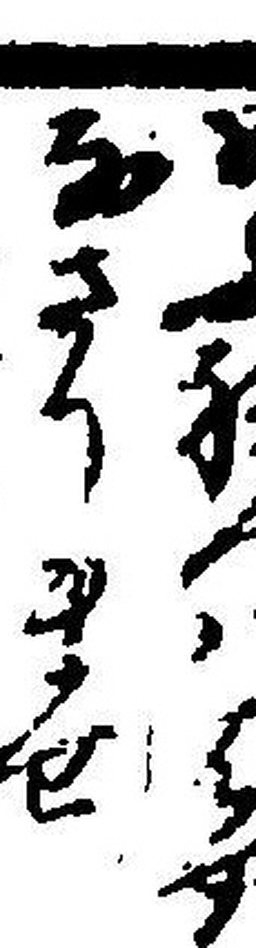なさりませ
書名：牡丹餅棚有 / 市場通笑作
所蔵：東京大学総合図書館 General Library in the University of Tokyo, JAPAN
